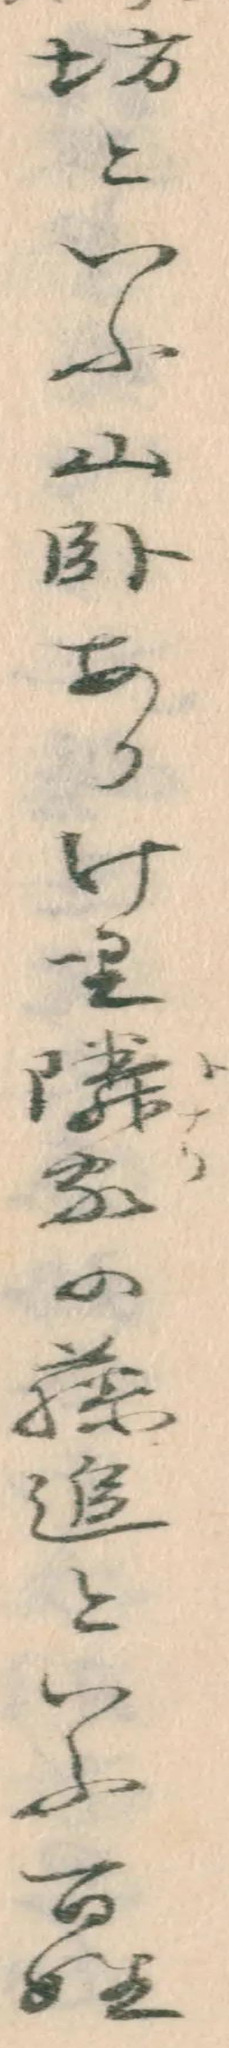坊といふ山卧ありけり隣家の藤追といふ百姓
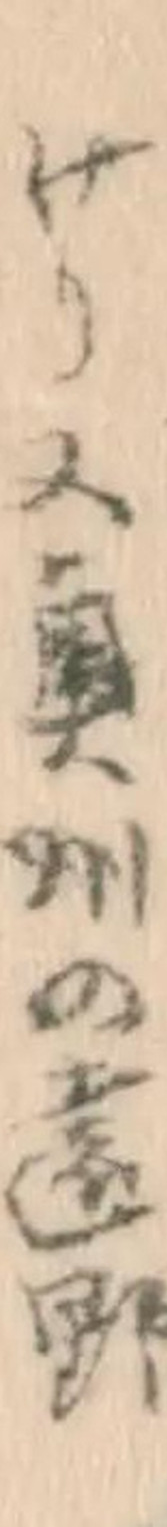けり又奥州の遠野
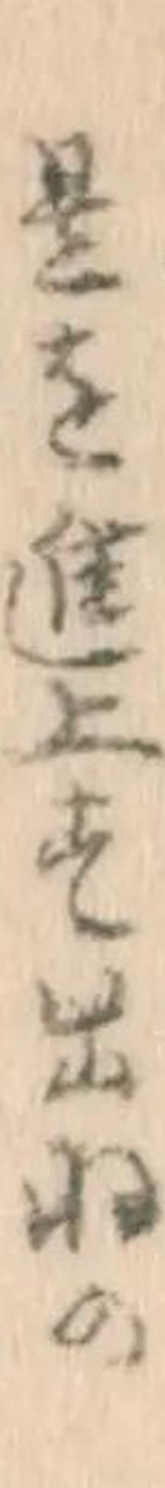是を進上す出羽の
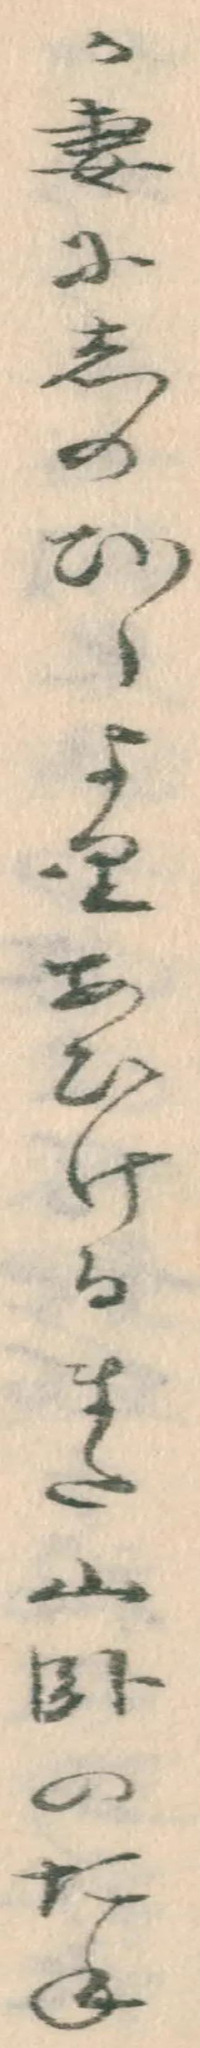か妻にしのひ〳〵よりあひけるまた山卧のたね
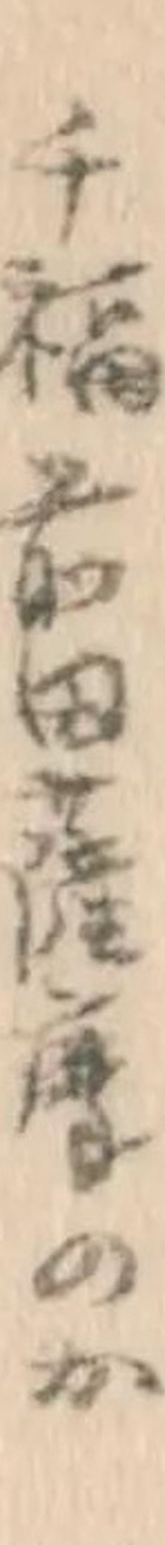千福前田薩摩のか
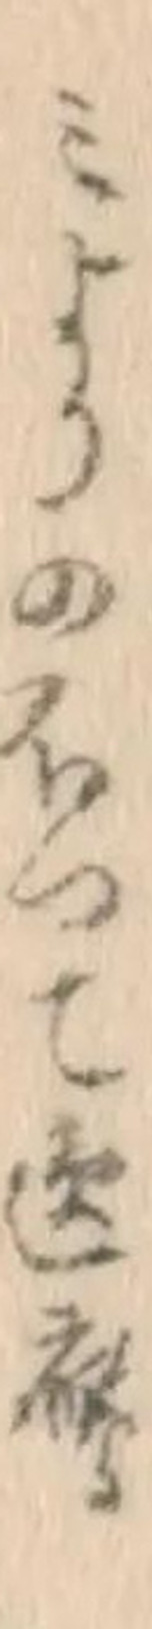みよりのほつて逸鷹
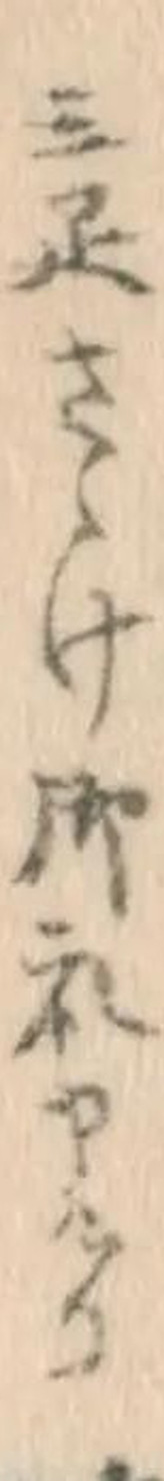三疋さゝけ御礼申ける
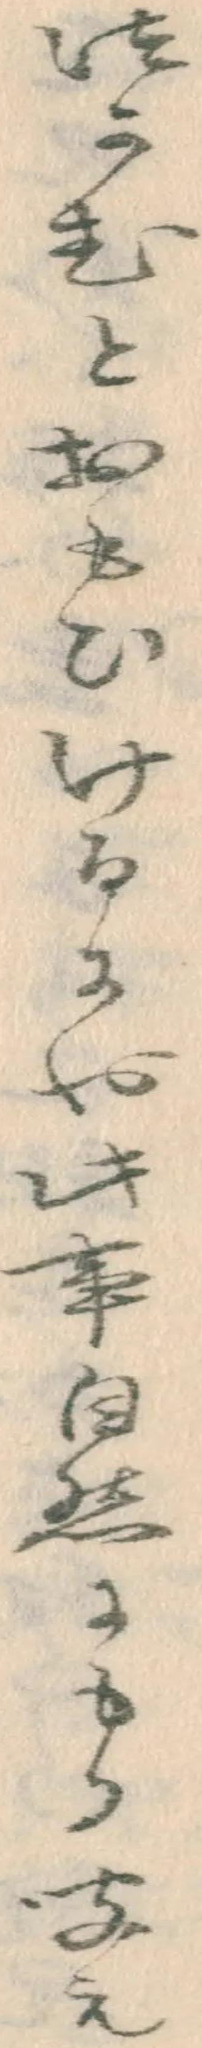つかむとおもひけるにや此事自然にもり聞え
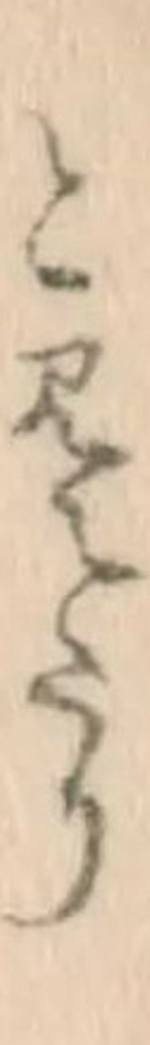と見えたり
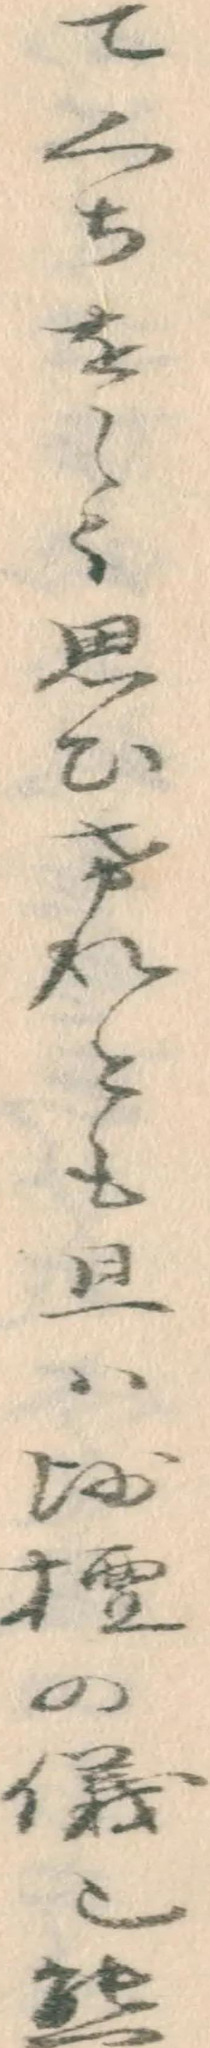てくちをしく思ひされとも且は師檀の儀也熊
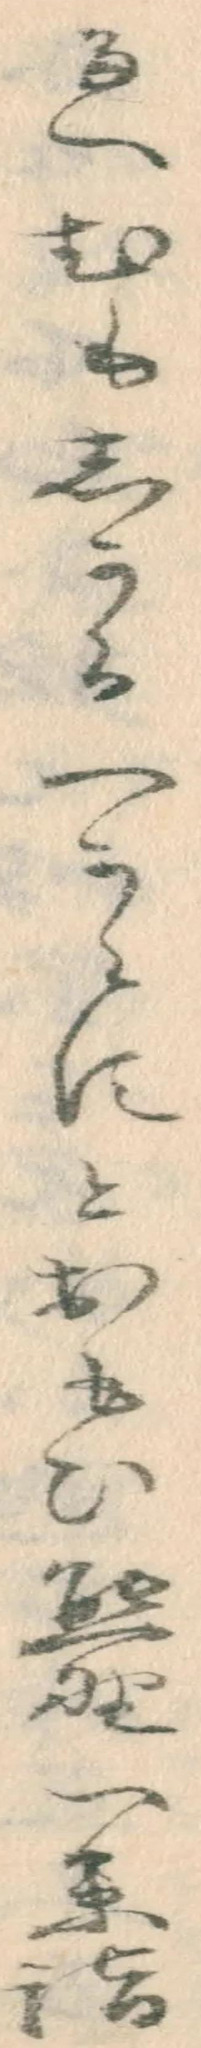るへむもしかるへからすとおもひ熊野へ参詣

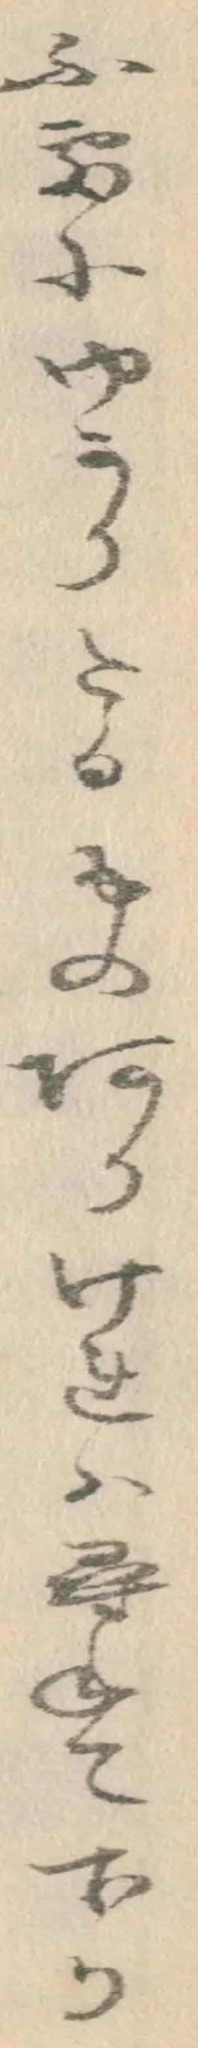ふ䖏にゆかりたるものありけれは尋ねて下り
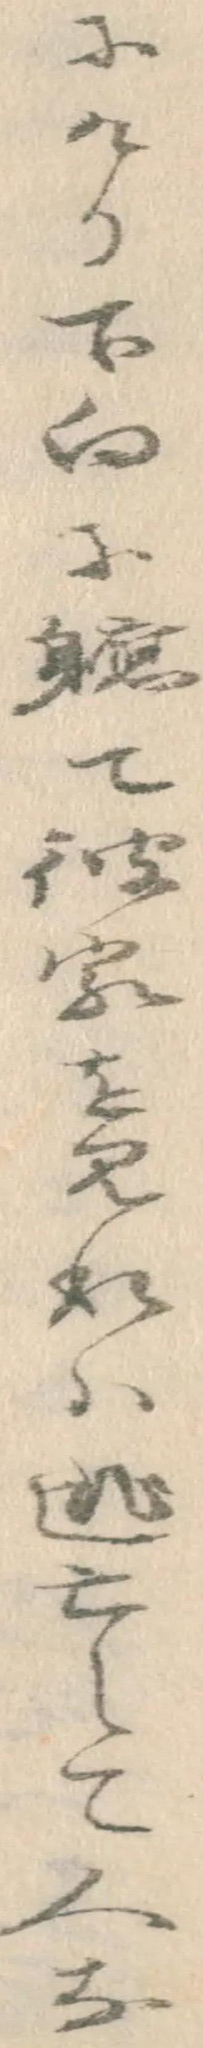にけり下向に軈て彼家を見れは逃亡して人な
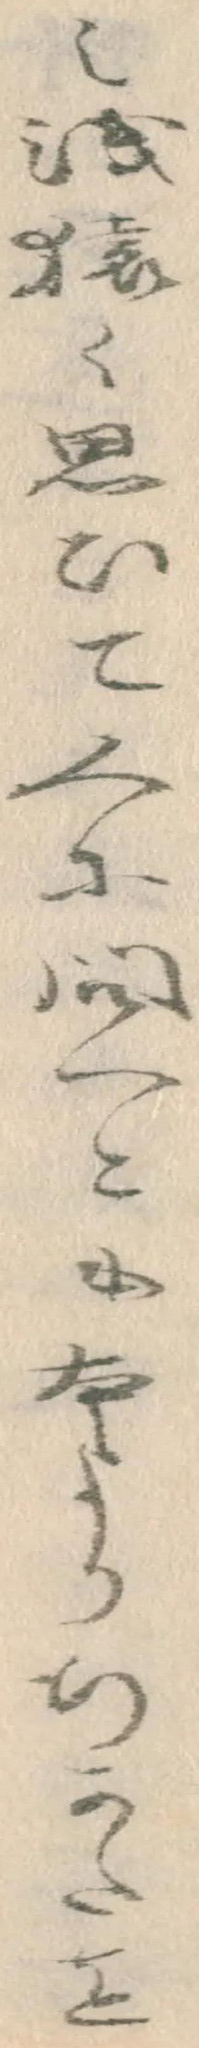し浅猿く思ひて人に問へとも本より行かたを
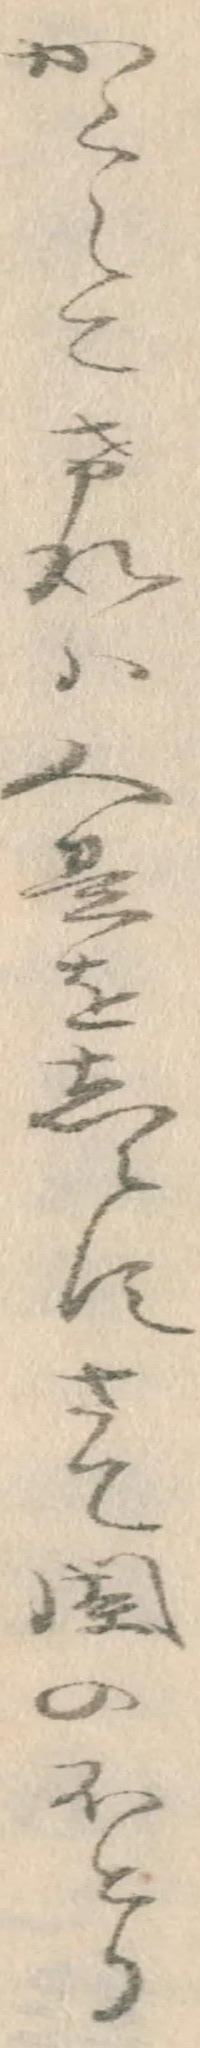かくしてされは人是をしらすさて関のほとり
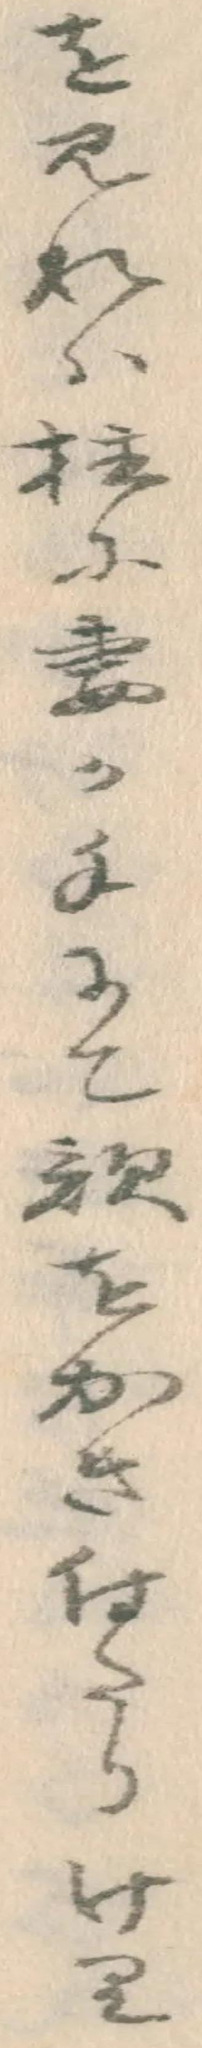を見れは柱に妻か手にて歌をかき付たりけり
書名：眞澄遊覽記[第2冊]
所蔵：国立国会図書館 National Diet Library, JAPAN
